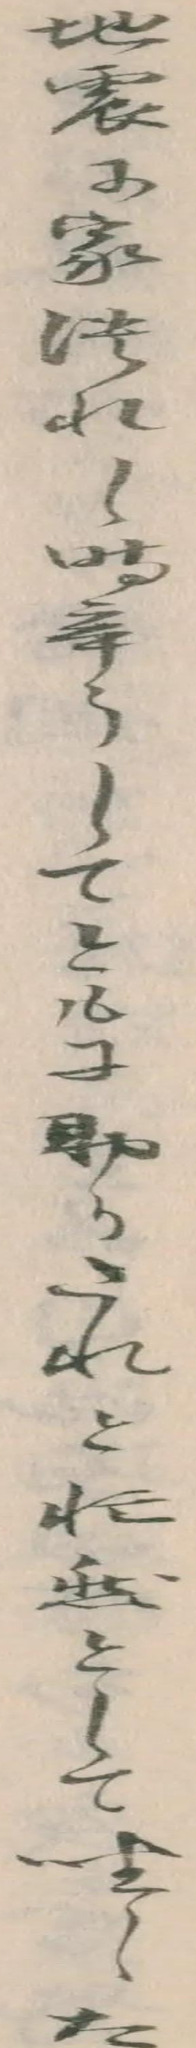地震に家潰れし時辛うしてともに助りたれと忙然として坐した
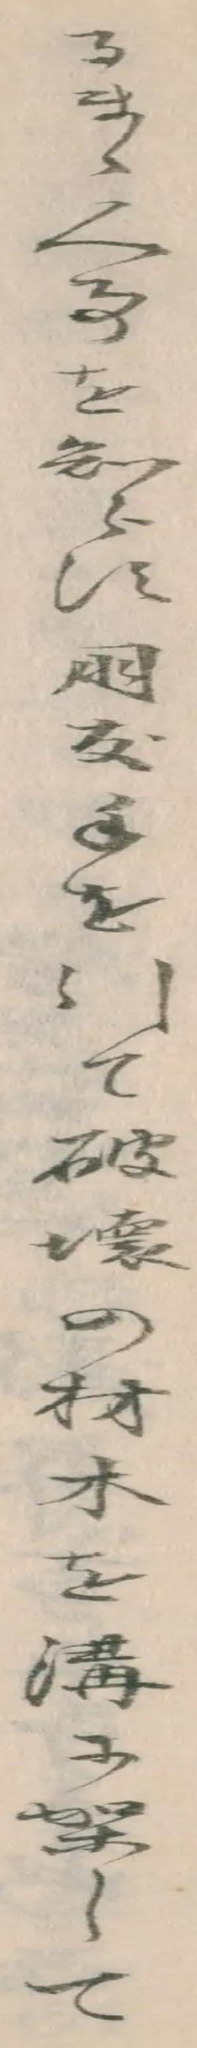るまゝ人事を知らす朋友手を引て破壊の材木を溝に架して
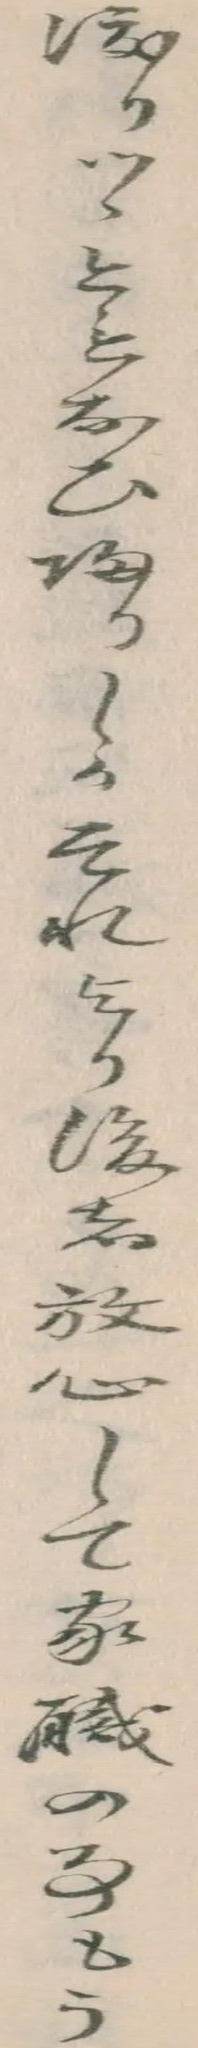渡りつゝともなひ帰りしかそれより後は放心して家職の事もう
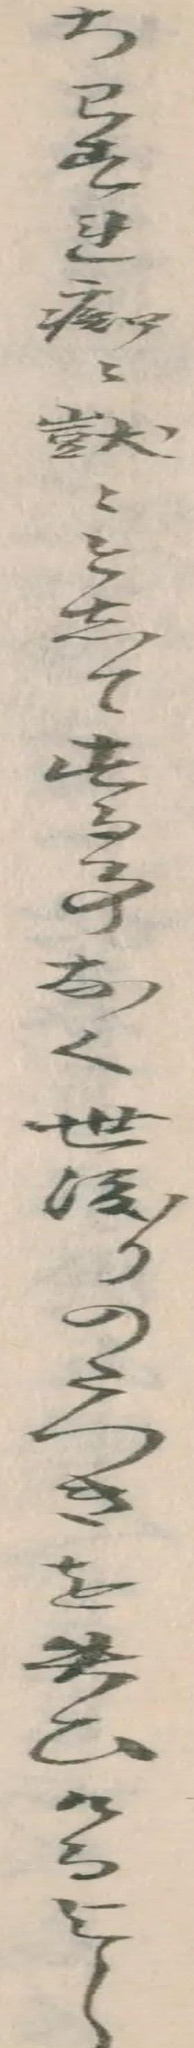ちわすれ痴々獃々としてする事なく世渡りのたつきを失ひけるよし
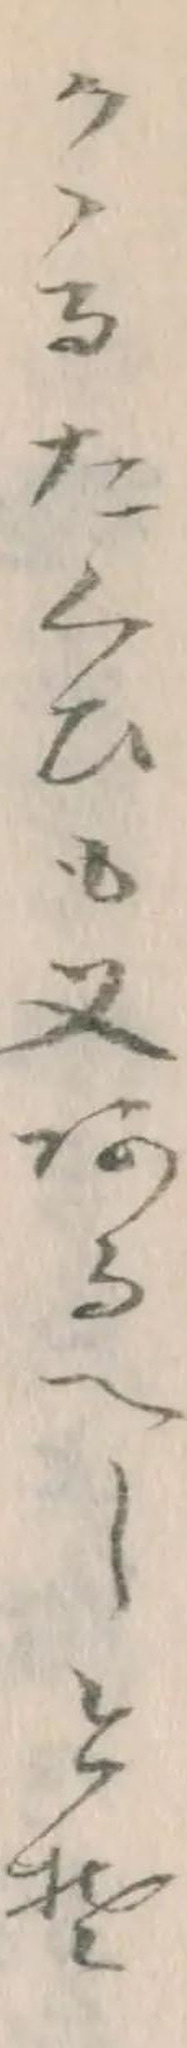かゝるたくひも又あるへしとそ
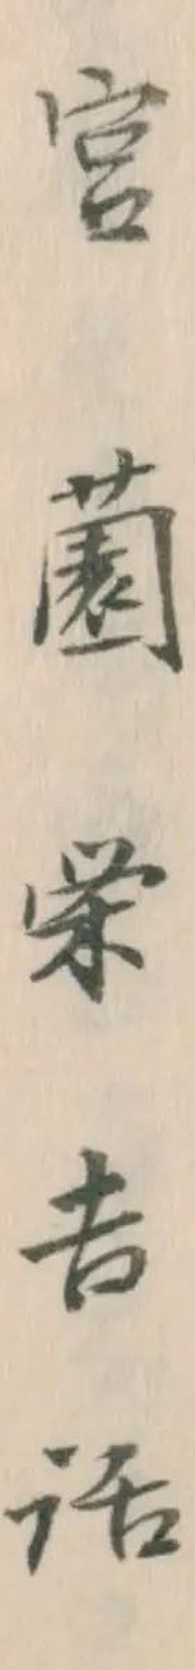宮薗栄吉話
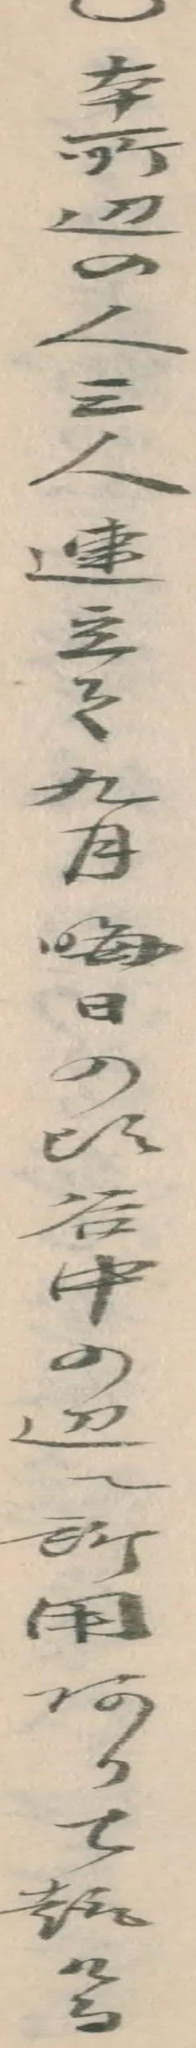〇本所辺の人三人連立て九月晦日の頃谷中の辺へ所用ありて趣きける

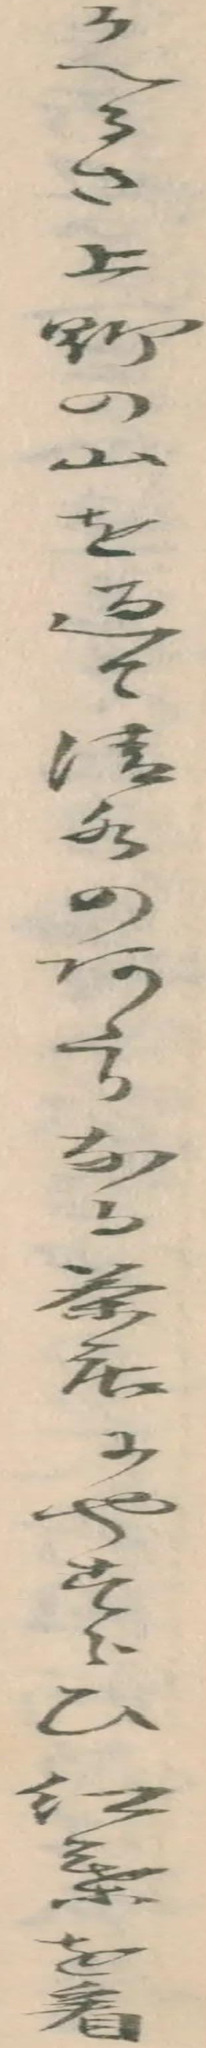かへるさ上野の山を通て清水のあたりなる茶店にやすらひ紅葉を看
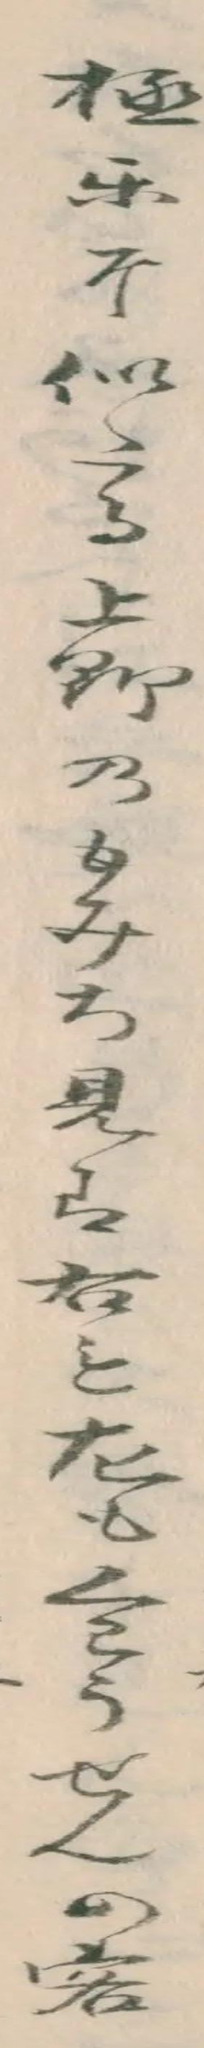極楽に似たる上野のもみち見は右も左もくわうせんの客
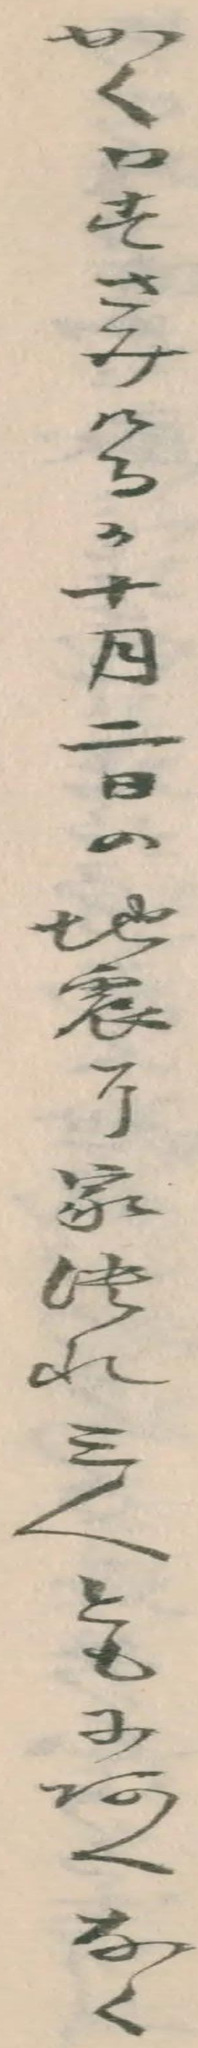かく口すさみけるか十月二日の地震に家潰れ三人ともにあへなく
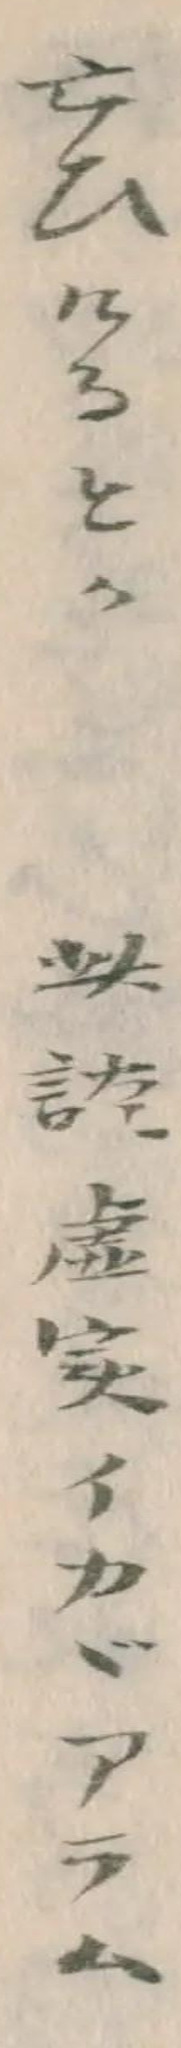亡ひけるとか此談虚実イカヾアラム
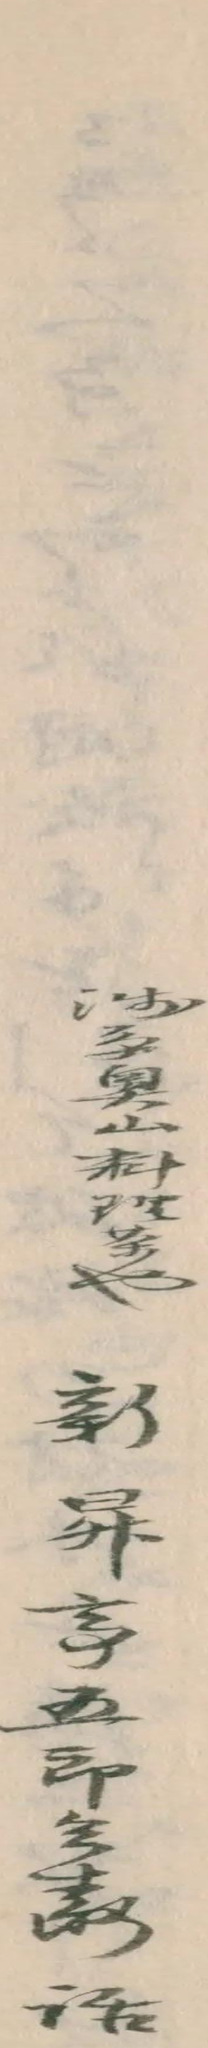浅草奥山料理茶や新昇亭五郎兵衛話
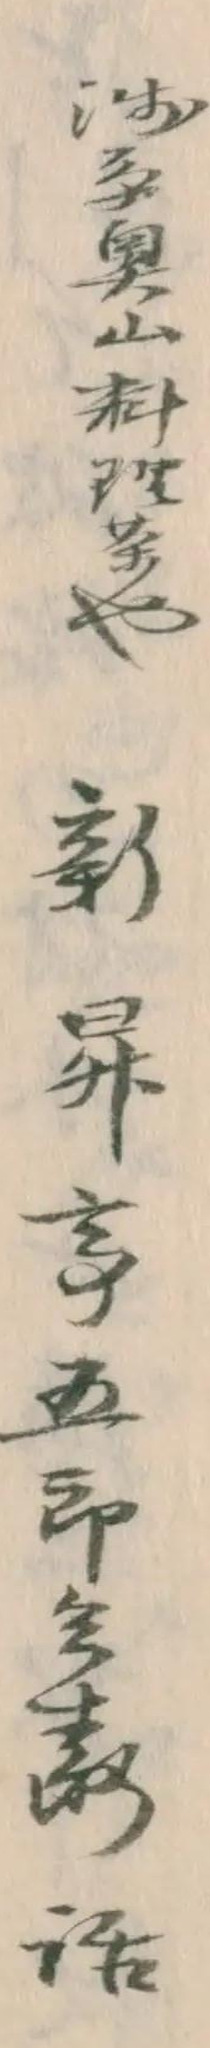浅草奥山料理茶や新昇亭五郎兵衛話
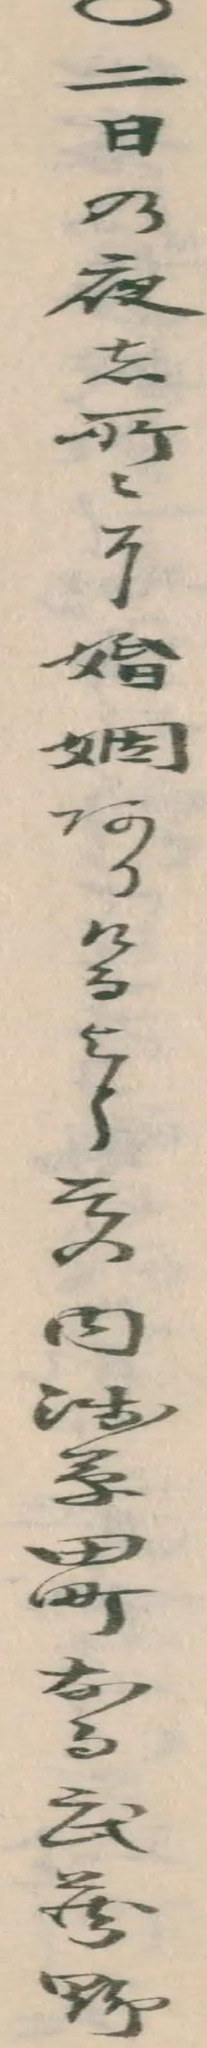〇二日の夜は所々に婚姻ありけるよしその内浅草田町なる武蔵野
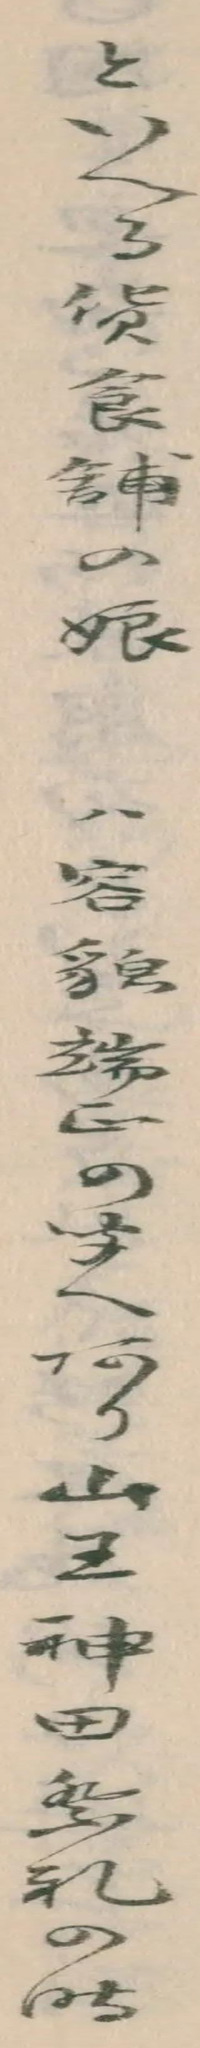といへる貨食舗の娘は容貌端正の聞へあり山王神田祭礼の時
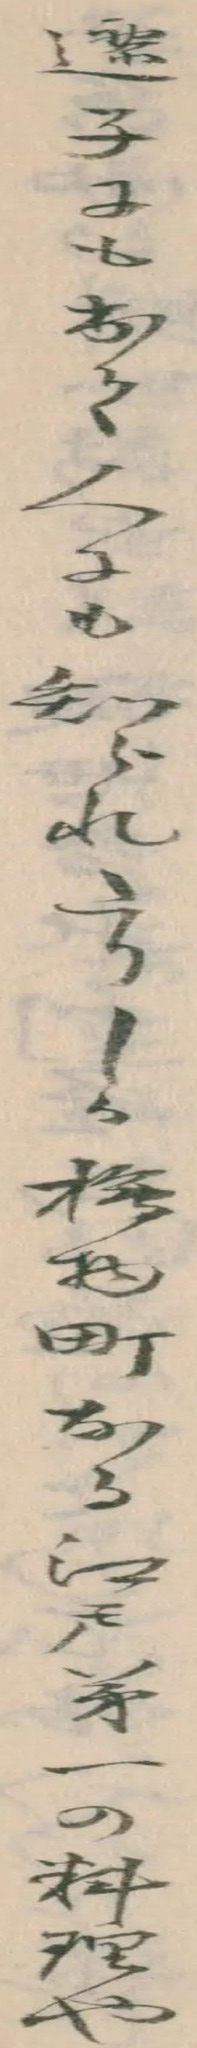邌子にも出て人にも知られたりしか檜物町なる江戸第一の料理や
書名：地災撮要. 巻7-9(地震之部)
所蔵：国立国会図書館 National Diet Library, JAPAN
